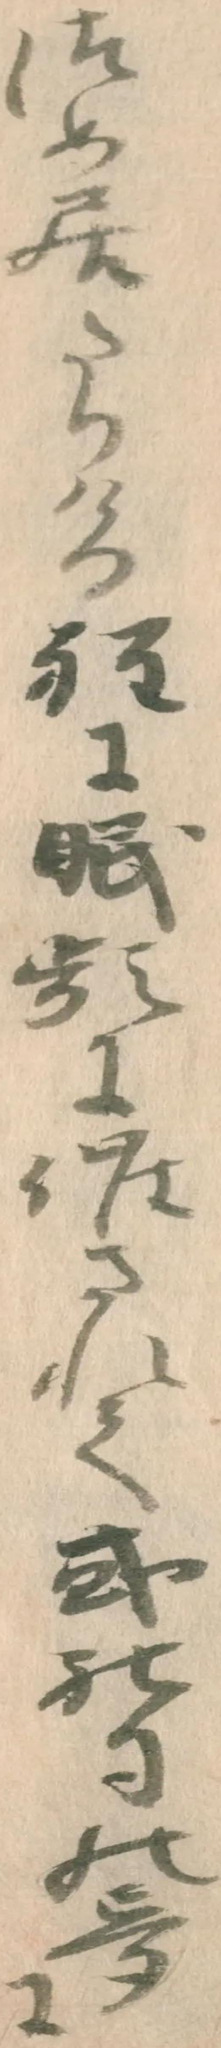つめ居たりける程に眠頻に催されて或社司の夢に
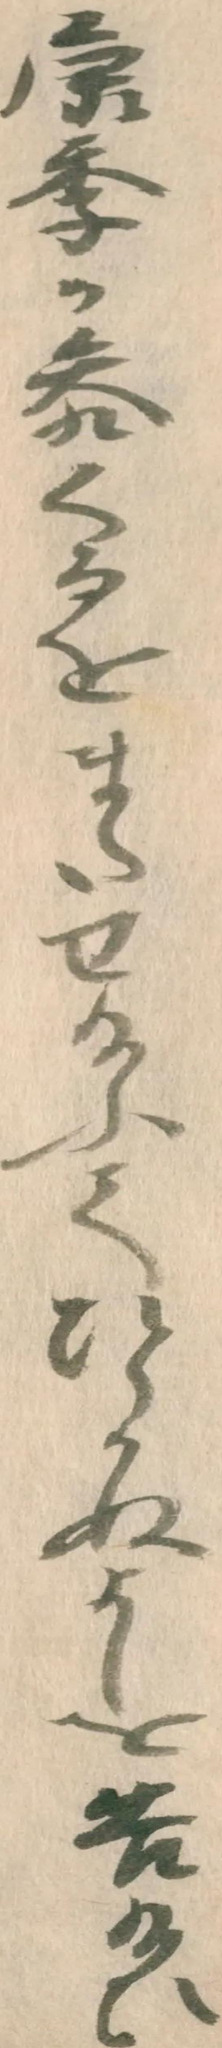康季か参くるをまたせ給ふてひらかぬよしを告給ひ
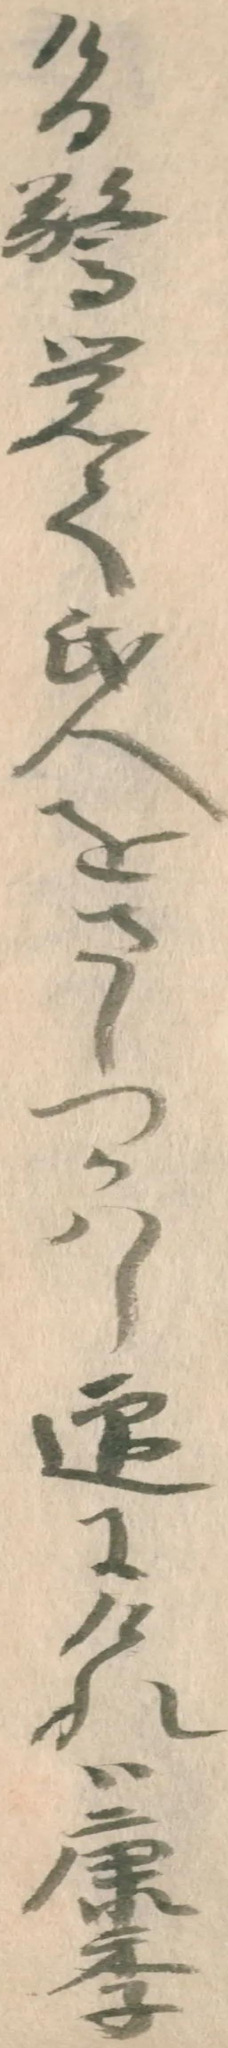ける驚覚て氏人をさしつかはし迎にけれは康季
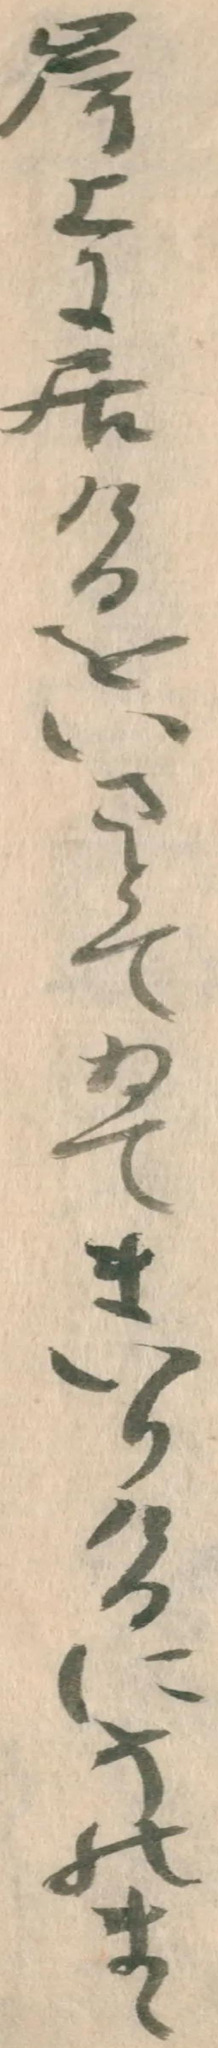岸上に居けるをいさとてゐてまいりけるにそのまゝ
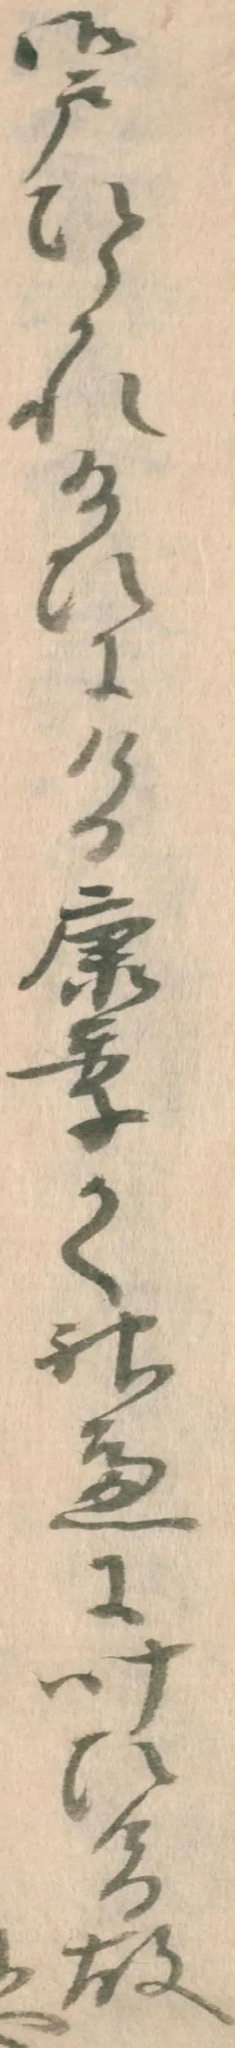御戸ひらかれ給ひにける康季かく神慮に叶ひける故にや
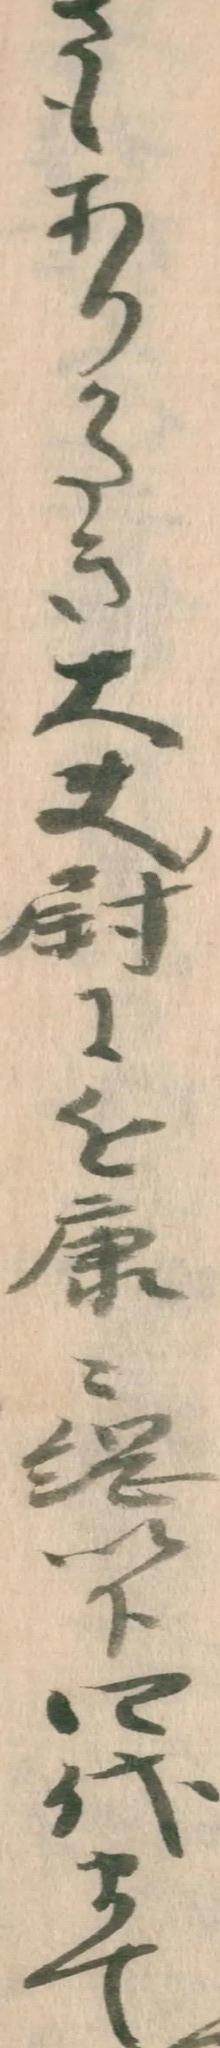さもありかたき大夫尉に近康々綱以下四代まて
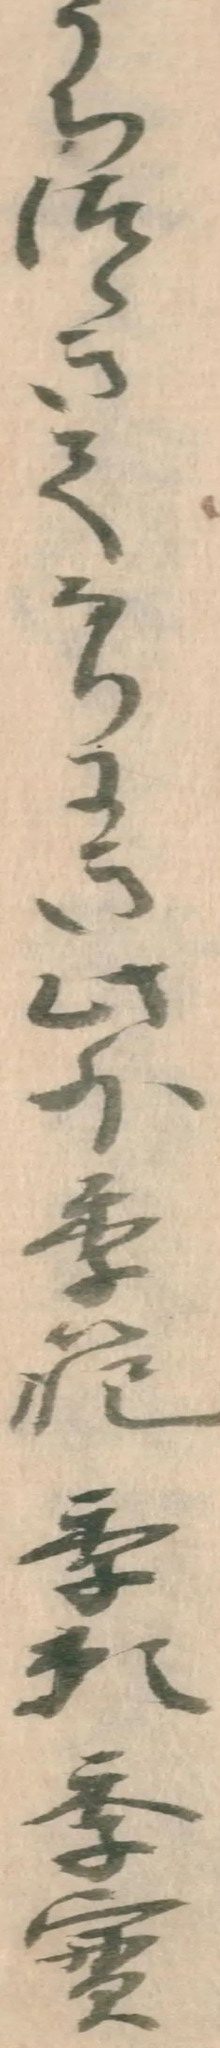うちつゝきてなりにき此外季範季頼季実
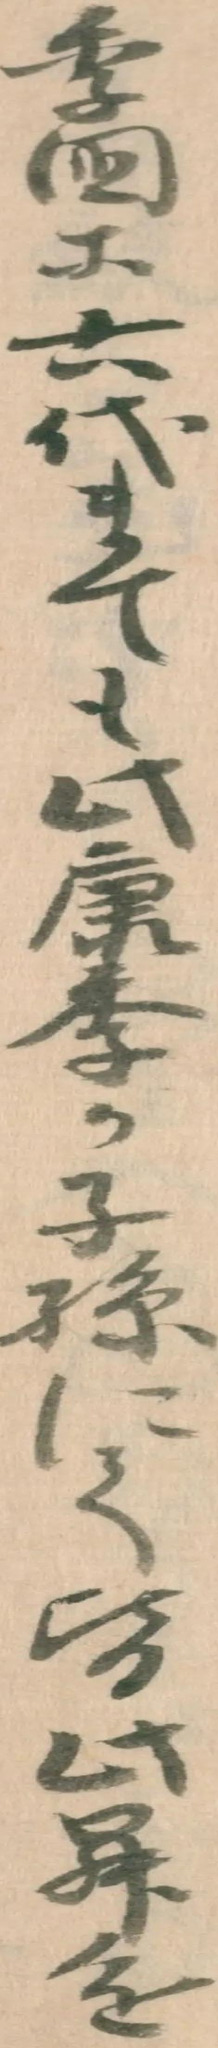季国等六代まても此康季か子孫にて皆此昇進
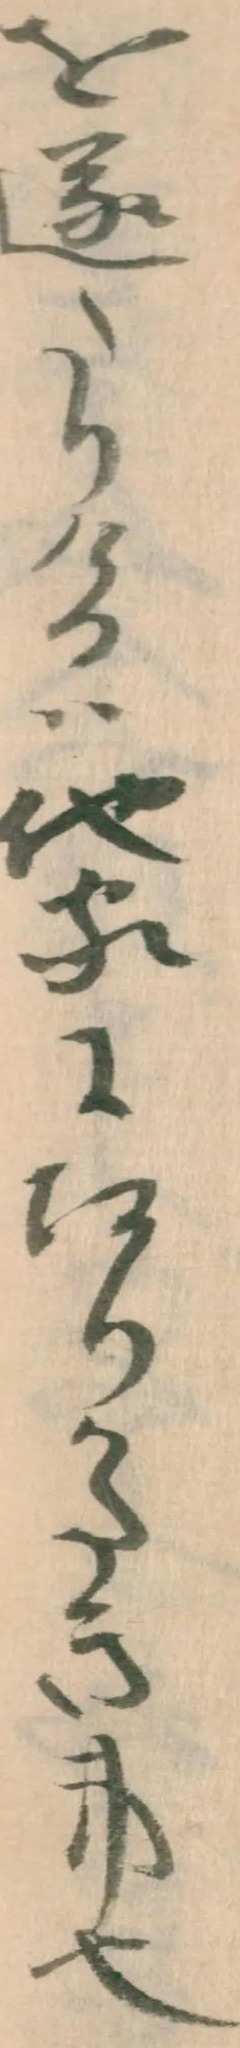を遂たりけるは他家にありかたき事也
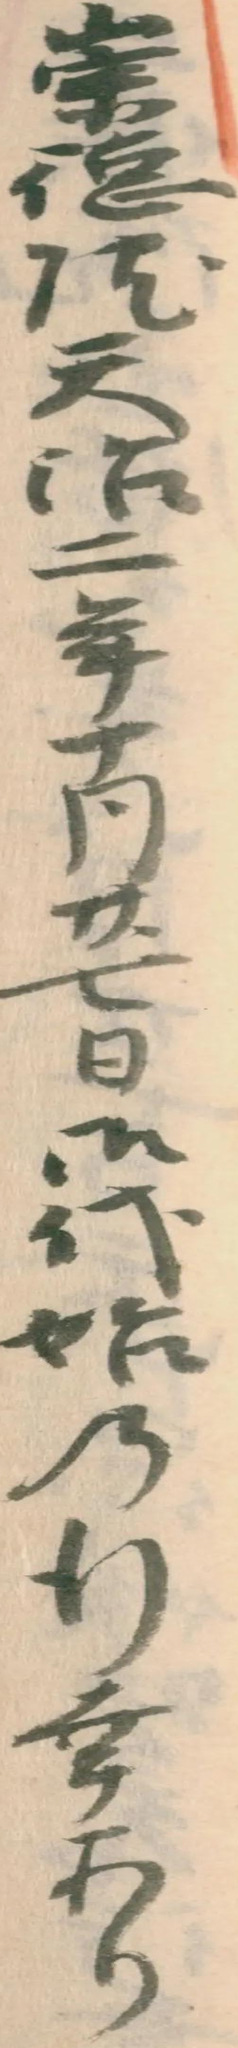崇徳院天治二年十月廿七日御代始の行幸あり
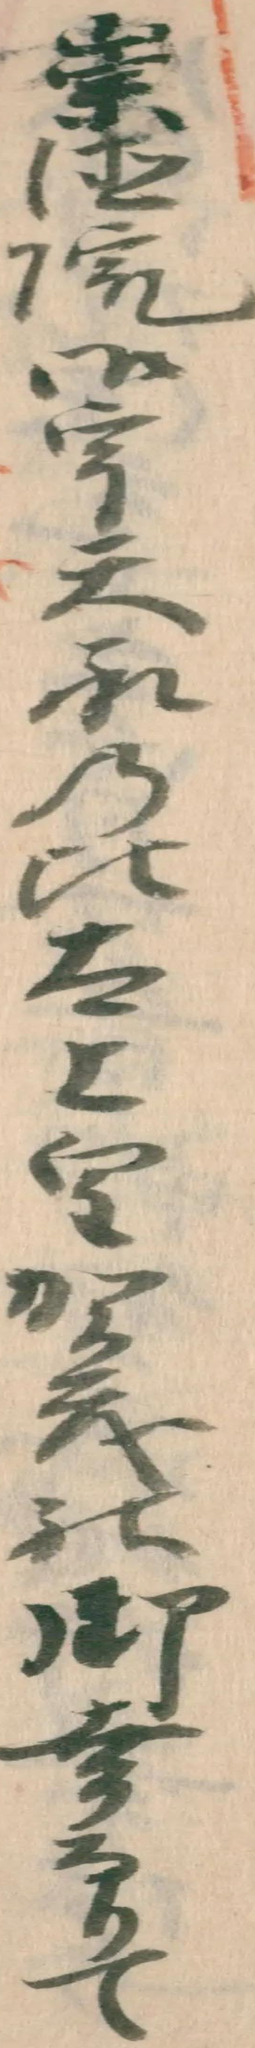崇徳院御宇天承の比太上皇賀茂社御幸なりて
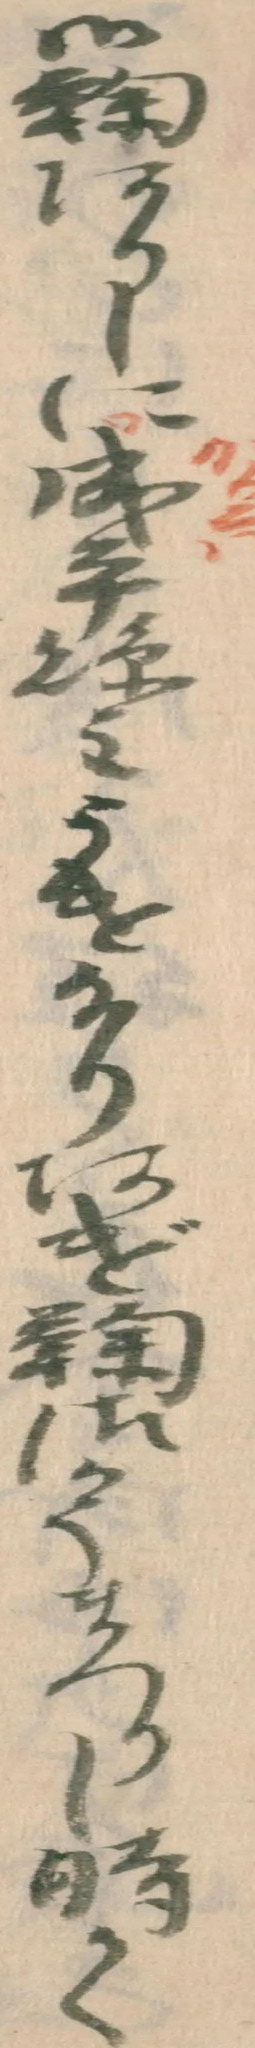御鞠ありしに◦成平縣主うけ給りあげ鞠つかうまつりし時かくよめる
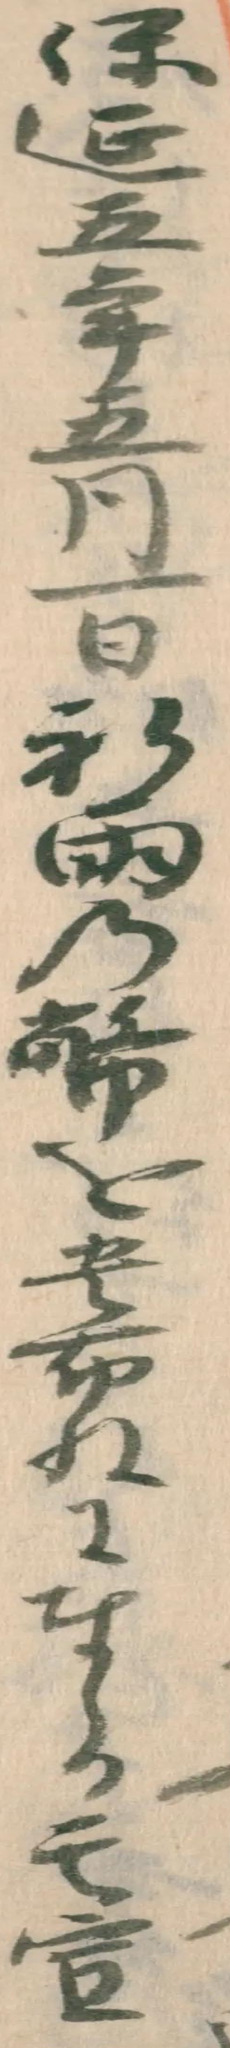保延五年五月一日祈雨の幣を貴ふねに奉らる其宣
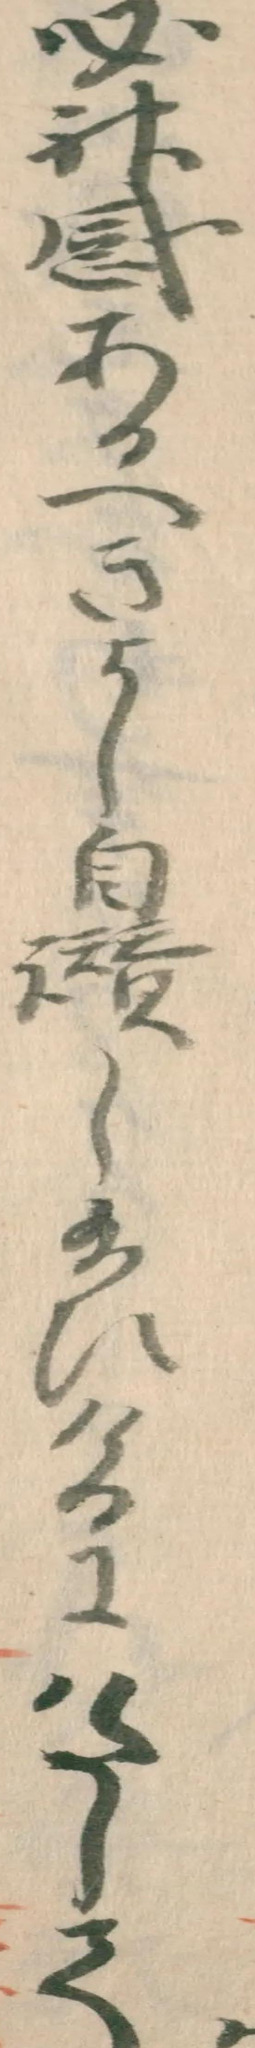必神感あるへきよし自讃し給ひけるにはたして
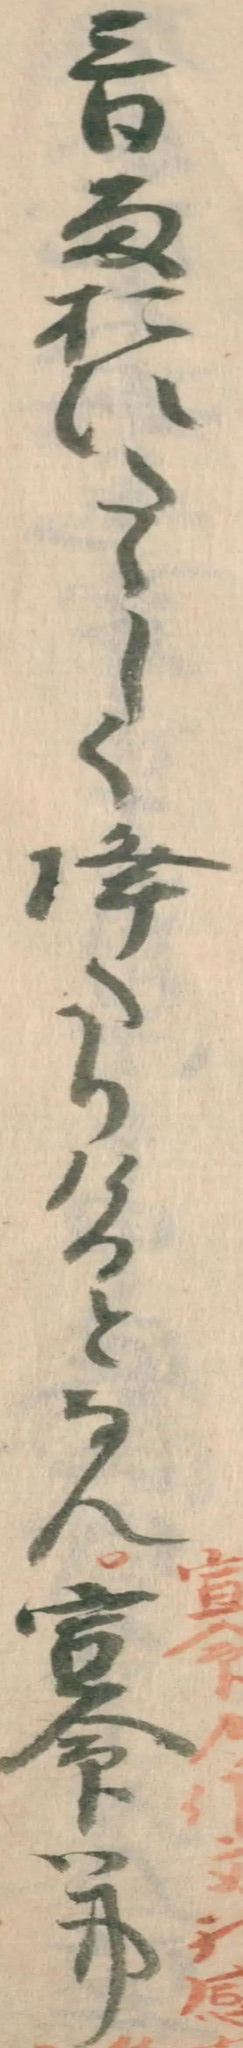三日雨おひたゝしく降たりけるとなん◦宣命は事
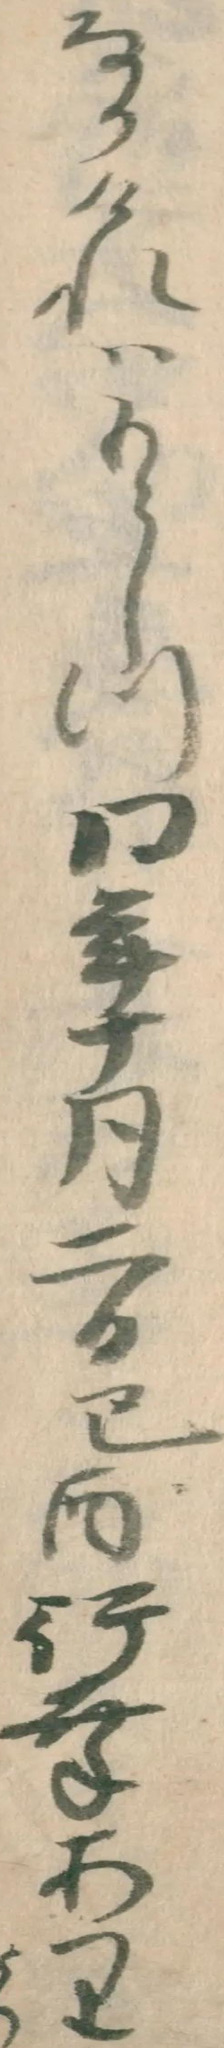なかけれはもらしつ同年十月二日己酉行幸ありけり
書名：賀茂社記録. 第1冊
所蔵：国立国会図書館 National Diet Library, JAPAN
